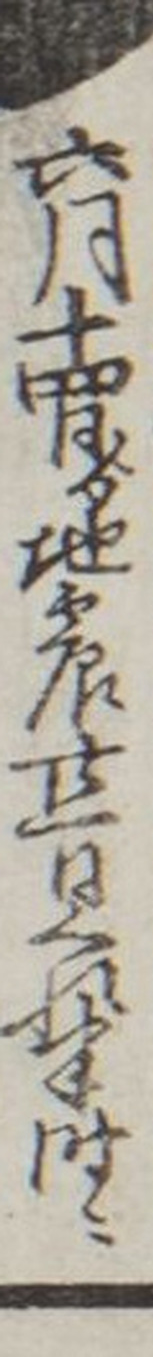六月十四日より地震廿一日くれ半時に
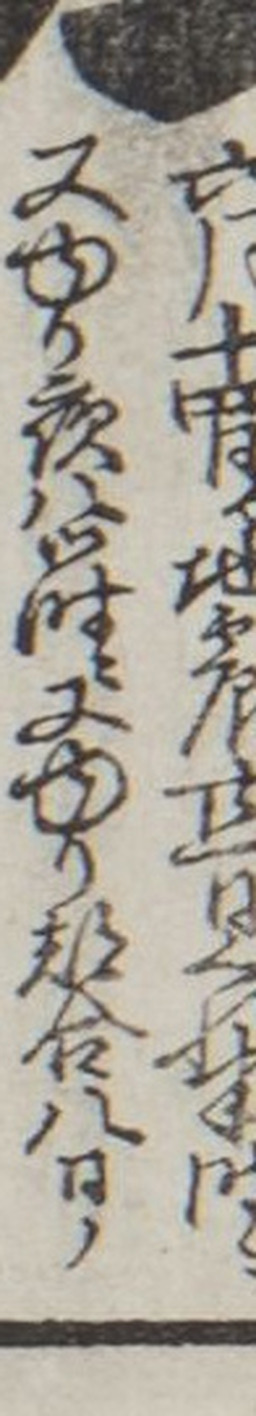又ゆり夜発八ッ時に又ゆり都合八日ノ
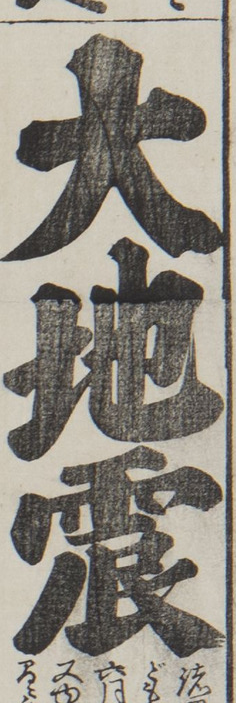大地震
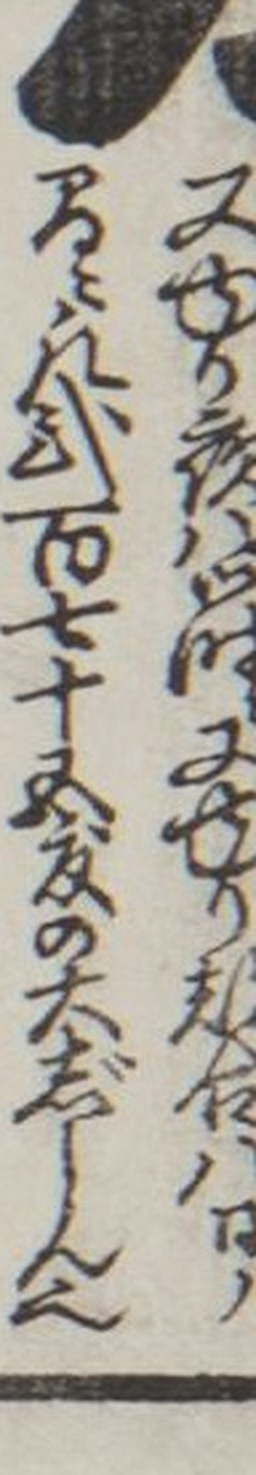間に凡弐百七十五度の大じしん也
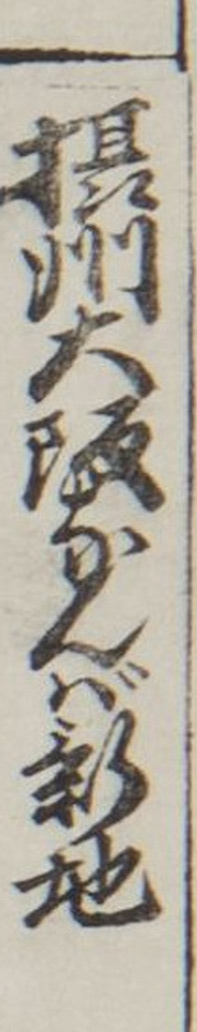摂州大坂なんば新地
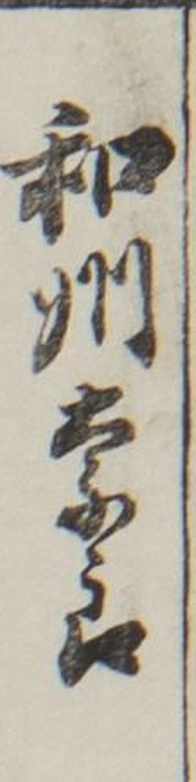和州奈良
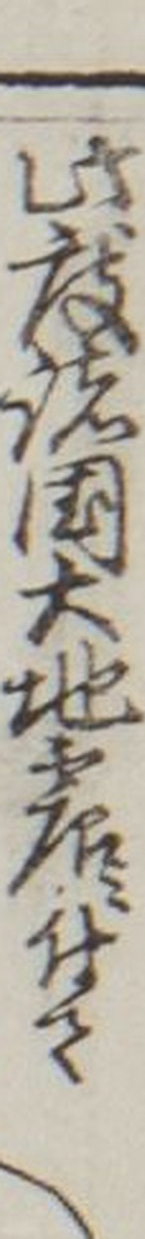此度諸国大地震に付て
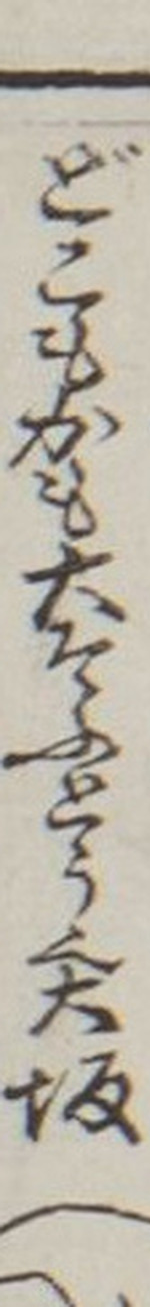どこもかも大そふとう也大坂
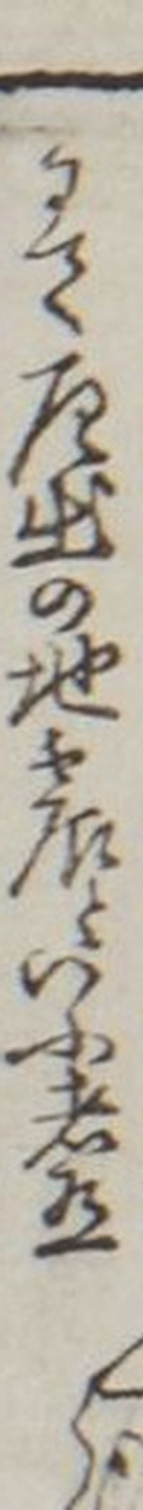にて尼出の地震といふ者有
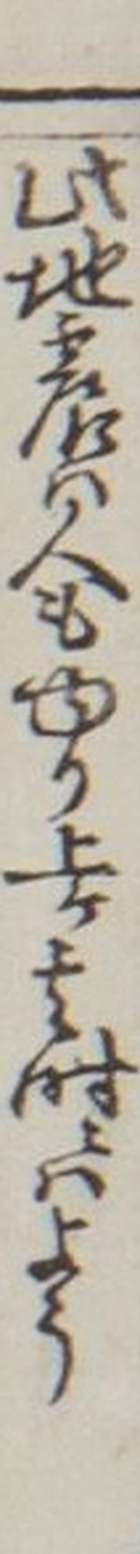此地震は人もゆり上け其時にはよう
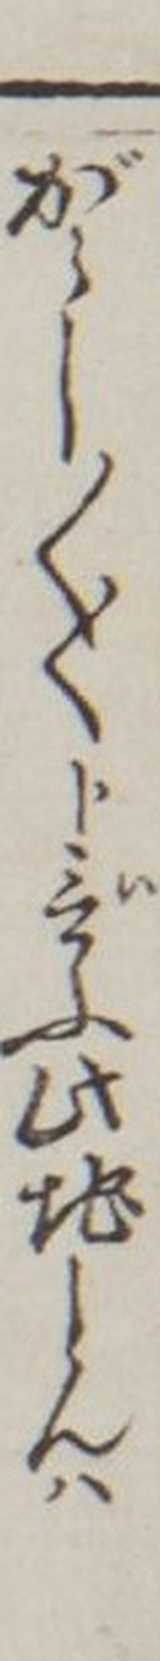がらし〳〵〳〵と言ふ此地しんは
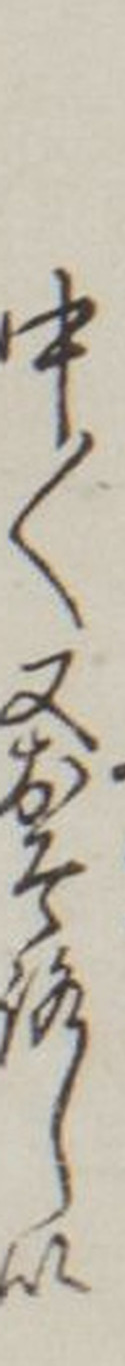中〳〵又おそろしい
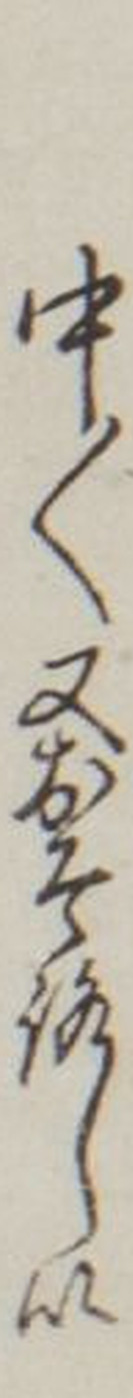中〳〵又おそろしい
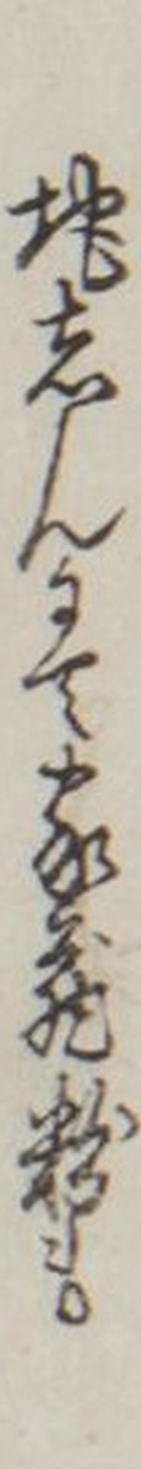地しんにて家蔵粉も
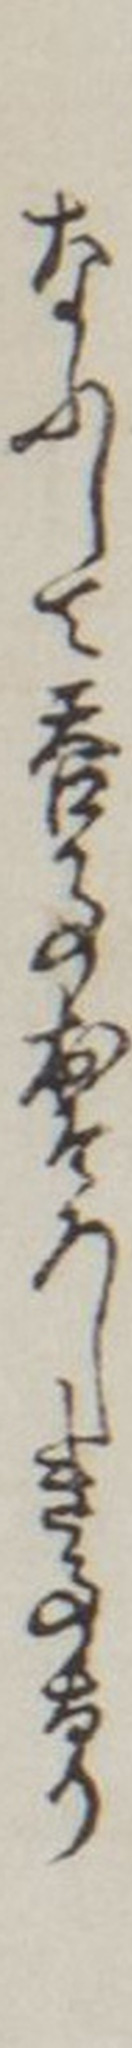なふして呑事おそろしき事なり
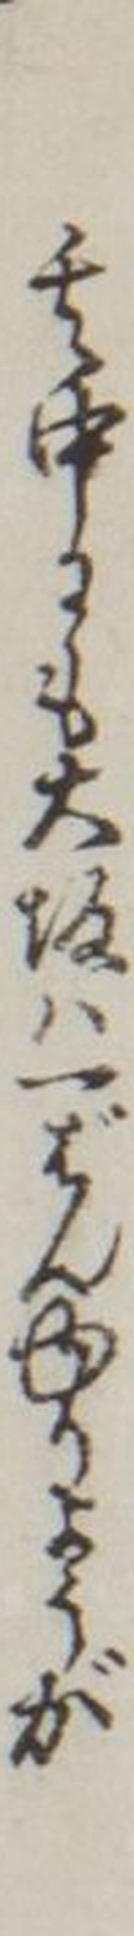其中にも大坂は一ばんゆりようが
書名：早飛脚廻りにてくわしき所本しらべ大地震
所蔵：あいおいニッセイ同和損保株式会社
